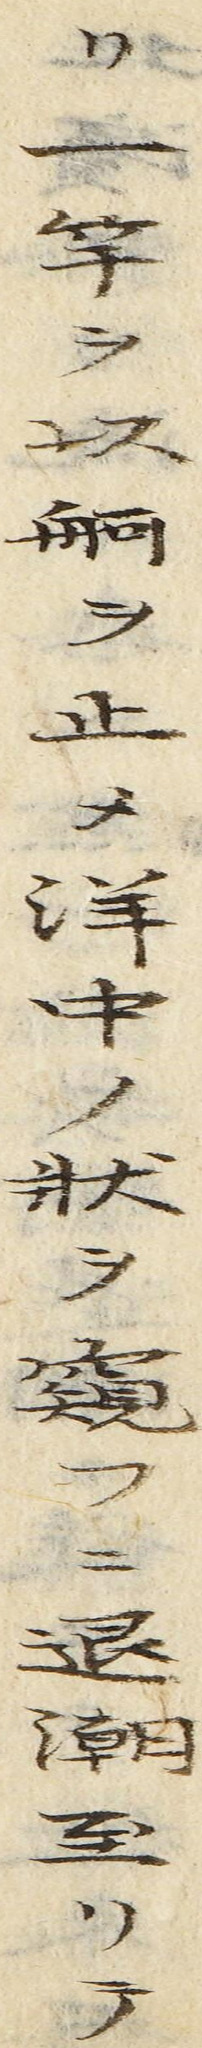リ一竿ヲ以舸ヲ止メ洋中ノ状ヲ窺フニ退潮至リテ
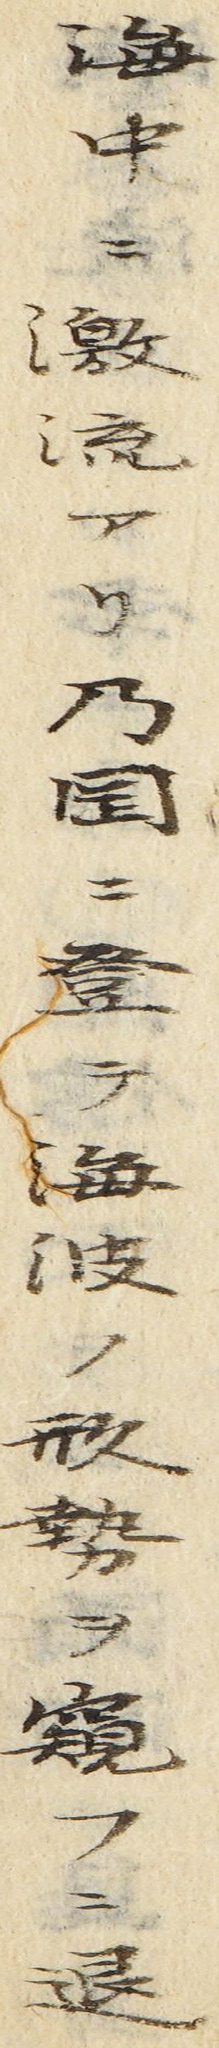海中ニ激流アリ乃岡ニ登テ海波ノ形勢ヲ窺フニ退

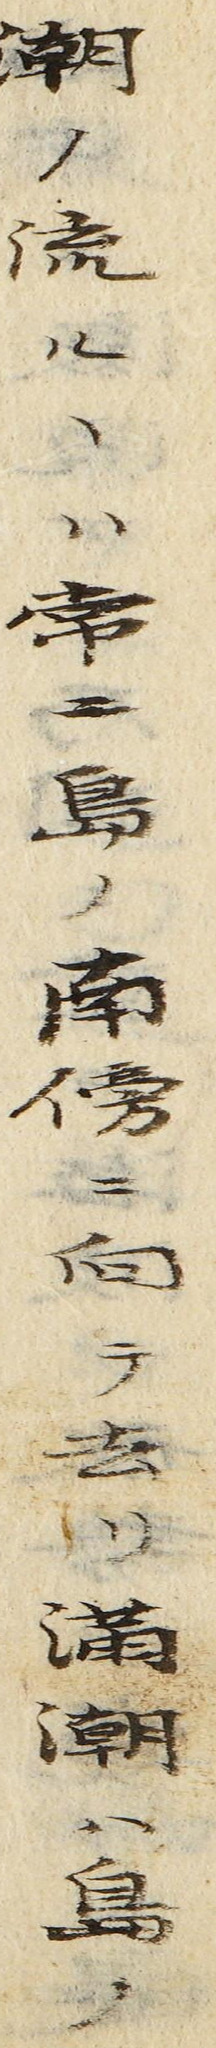潮ノ流ルヽハ常ニ島ノ南傍ニ向テ去リ満潮ハ島ノ
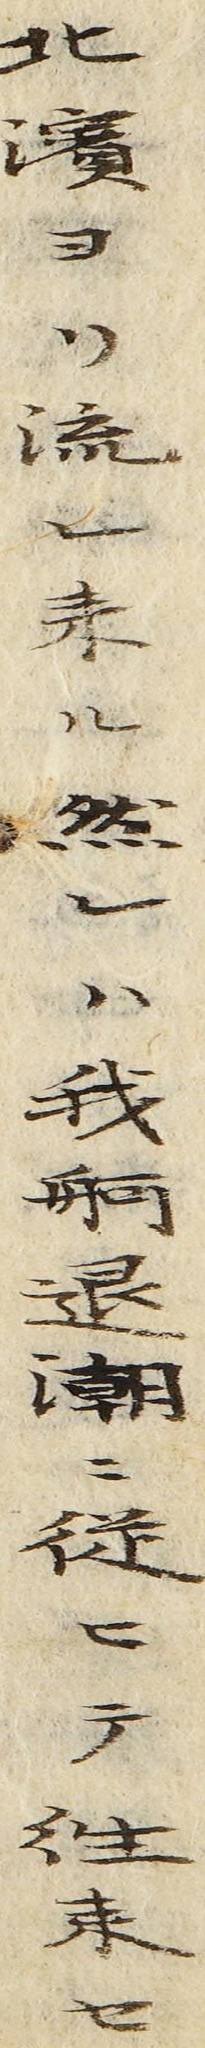北浜ヨリ流レ来ル然レハ我舸退潮ニ従ヒテ往来セ
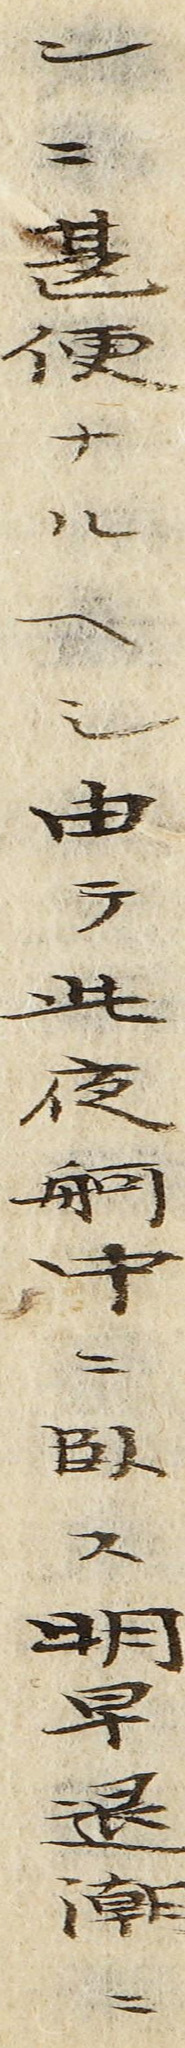ンニ甚便ナルヘシ由テ此夜舸中ニ臥ス明早退潮ニ
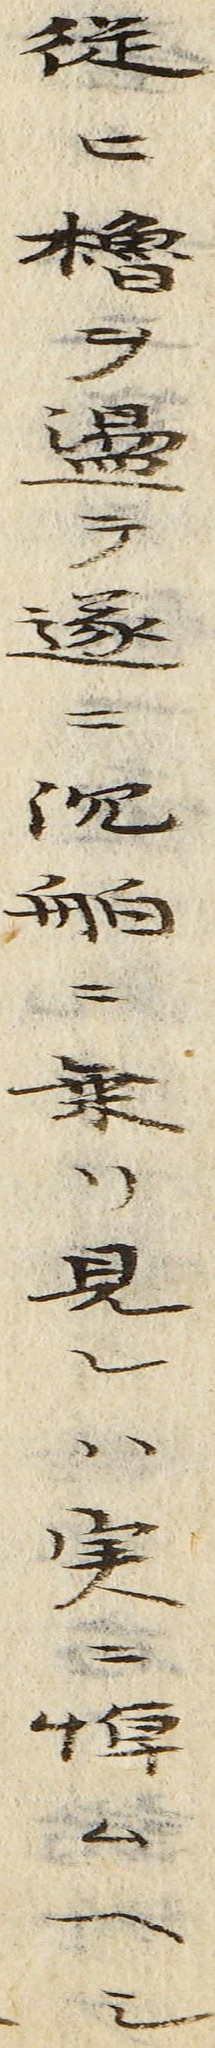従ヒ櫓ヲ盪テ遂ニ沈舶ニ乗リ見レハ実ニ悼ムヘシ
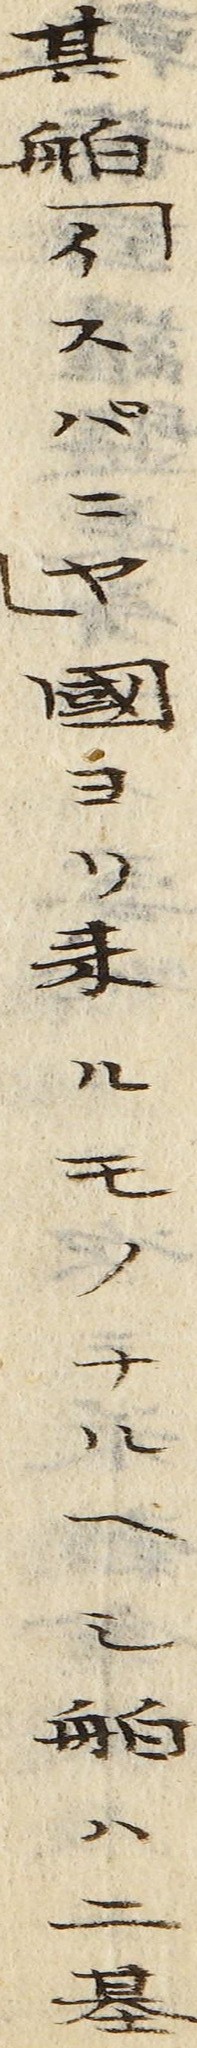其舶「イスパニヤ」国ヨリ来ルモノナルヘシ舶ハ二基
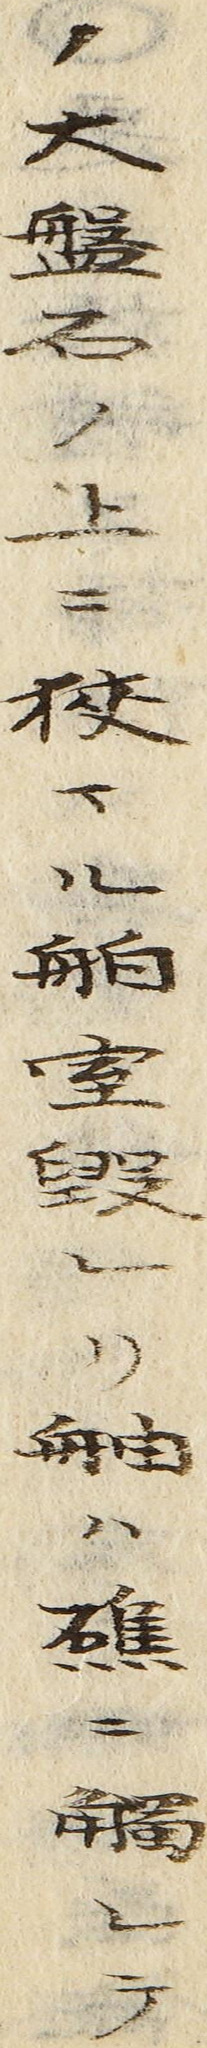ノ大盤石ノ上ニ挟マル舶室毀レリ舳ハ礁ニ触レテ
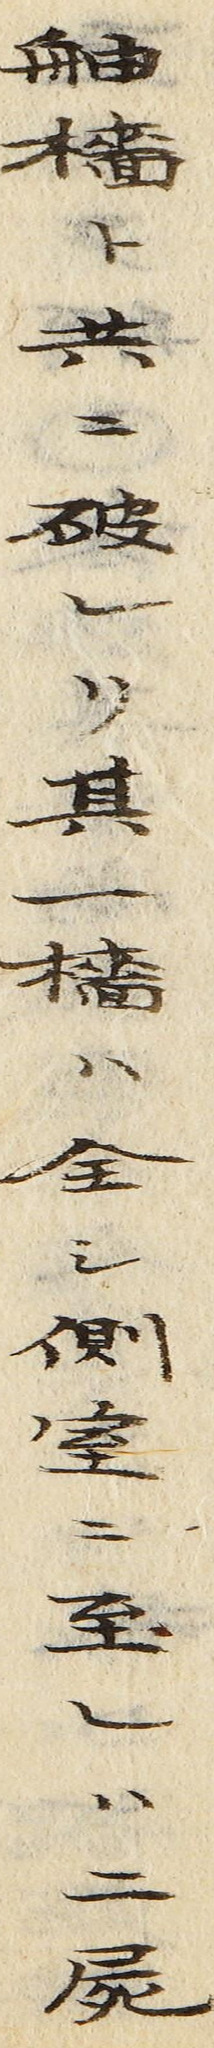舳檣ト共ニ破レリ其一檣ハ全シ側室ニ至レハ二屍
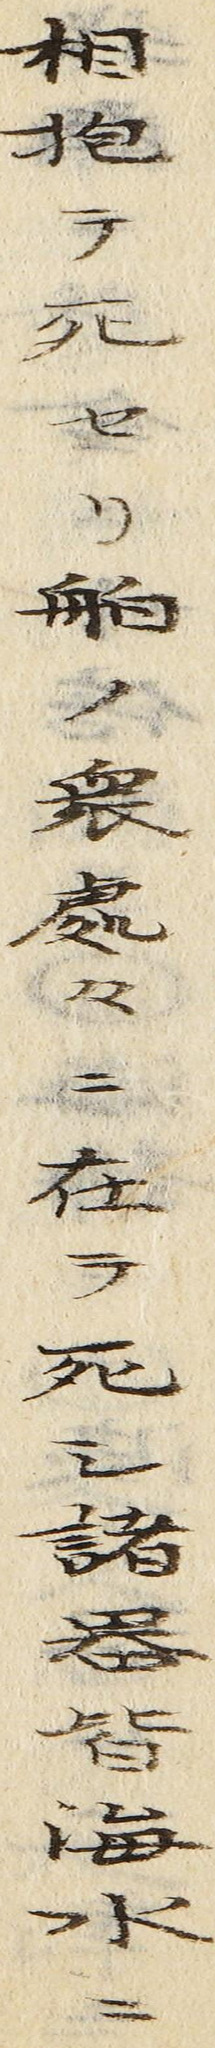相抱テ死セリ舶ノ衆処々ニ在テ死シ諸器皆海水ニ
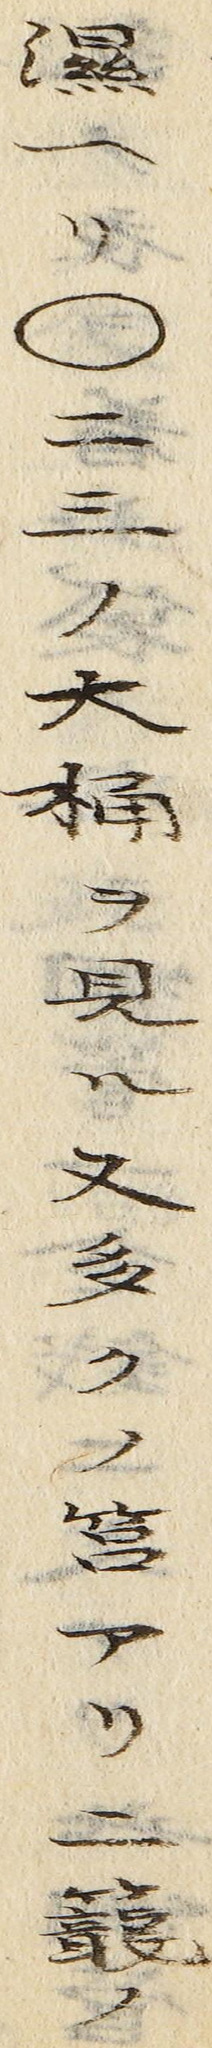湿ヘリ◯二三ノ大桶ヲ見ル又多クノ筥アリ二籠ノ
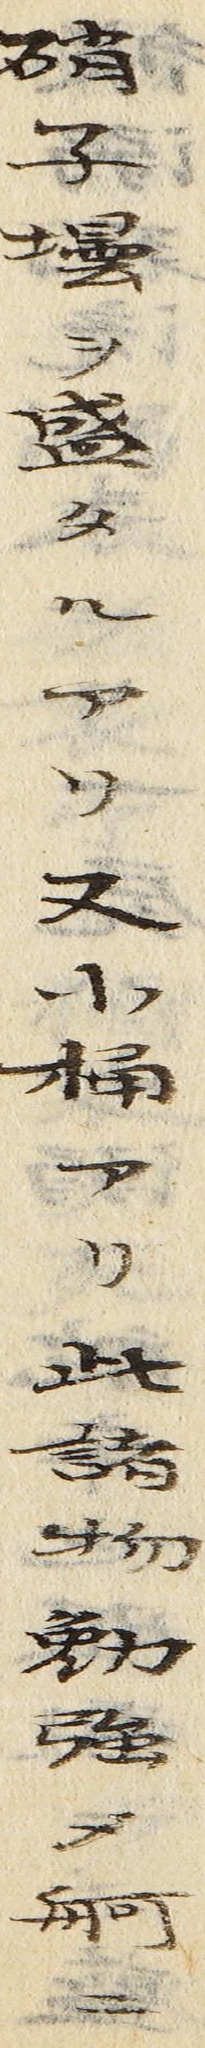硝子壜ヲ盛タルアリ又小桶アリ此諸物勉強シテ舸ニ
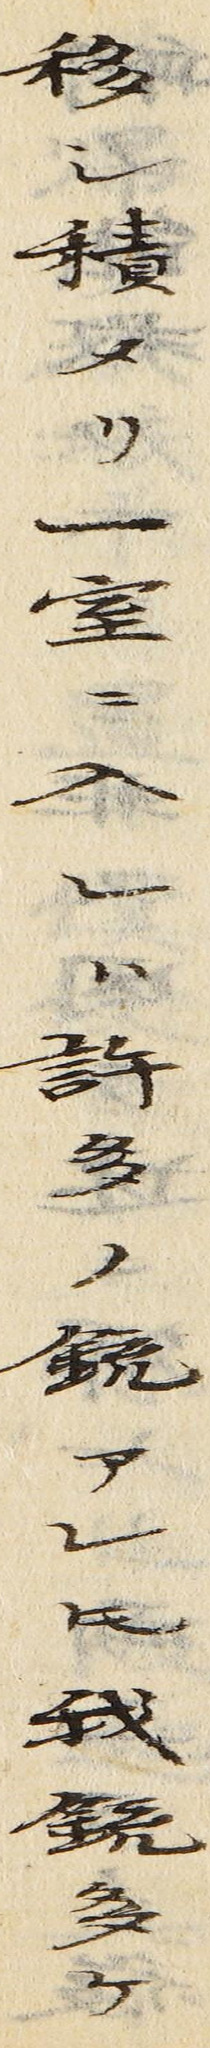移シ積メリ一室ニ入レハ許多ノ銃アレトモ我銃多ケ
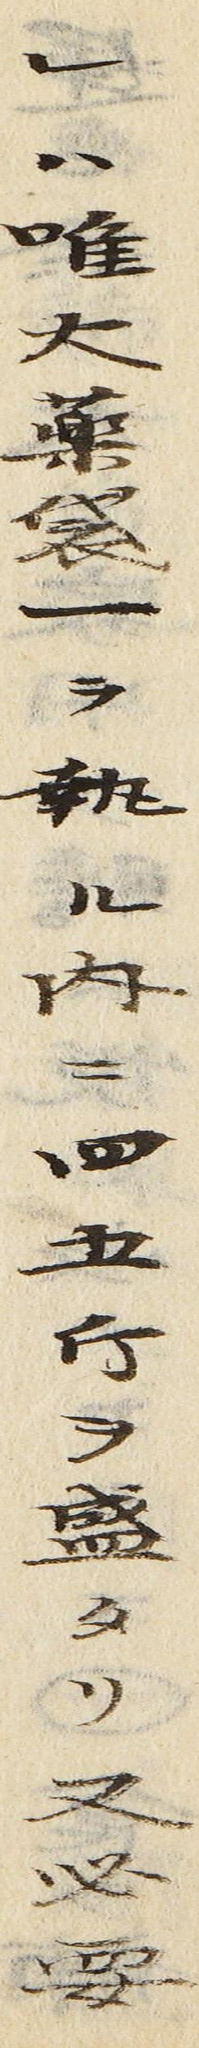レハ唯火薬袋一ヲ執ル内ニ四五斤ヲ盛タリ又必要
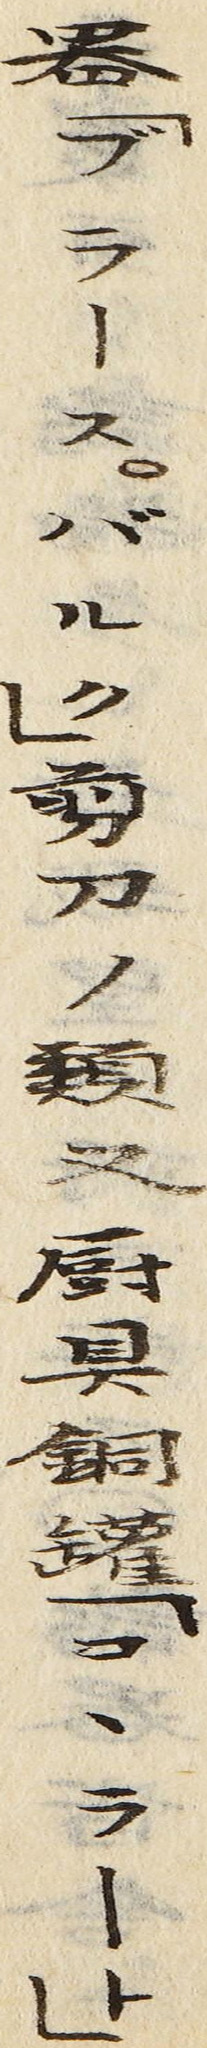器「ブラース。バルク」剪刀ノ類又厨具銅缶「コヽラート」
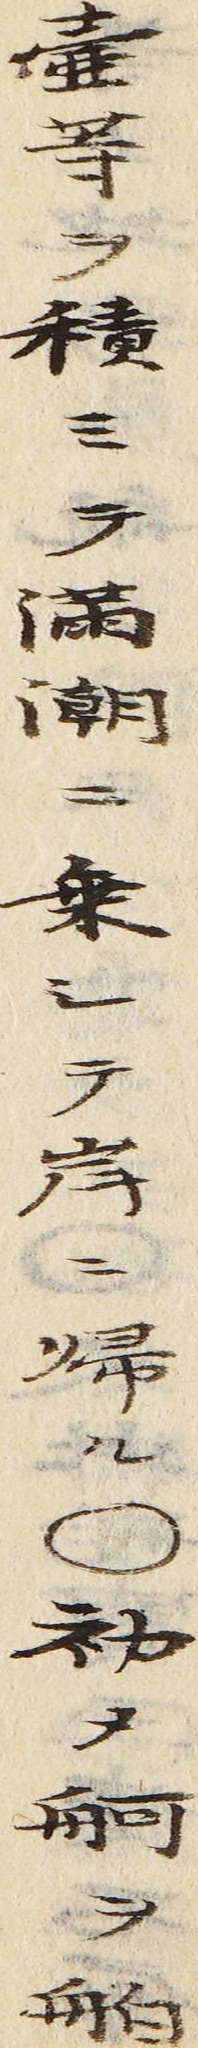壺等ヲ積ミテ満潮ニ乗シテ岸ニ帰ル◯初メ舸ヲ舶
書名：漂流紀事
